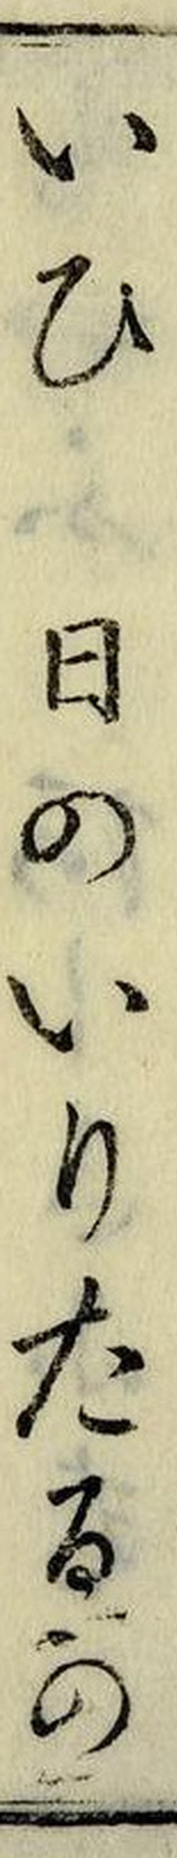いひ日のいりたるの
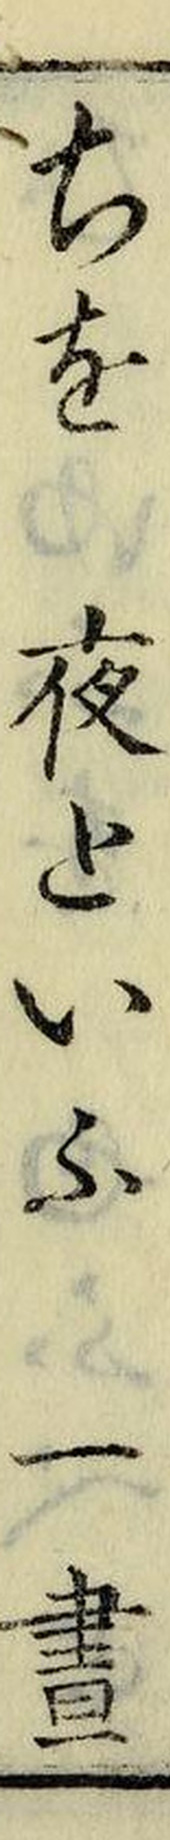ちを夜といふ一昼
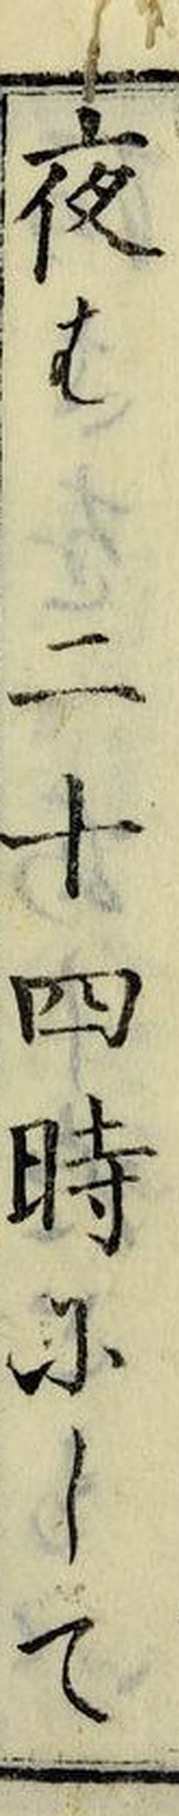夜は二十四時にして
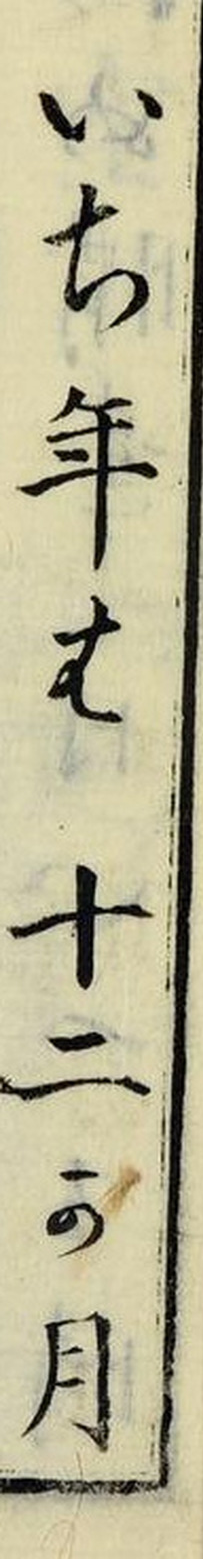いち年は十二か月
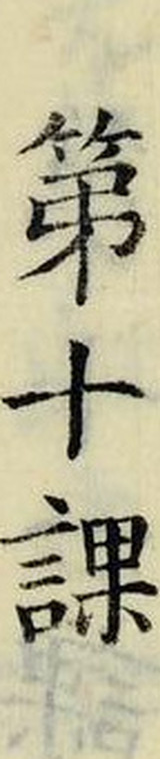第十課
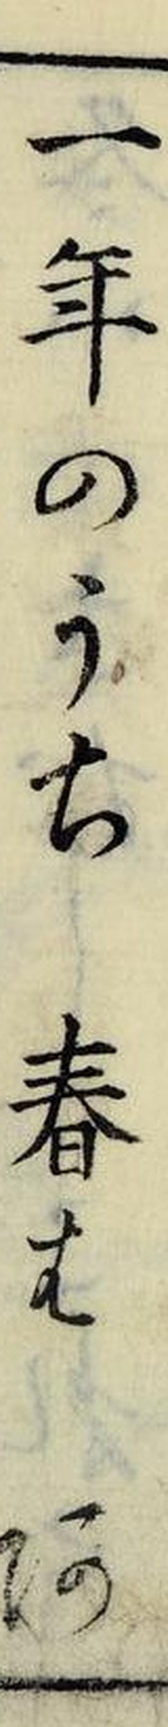一年のうち春はあ
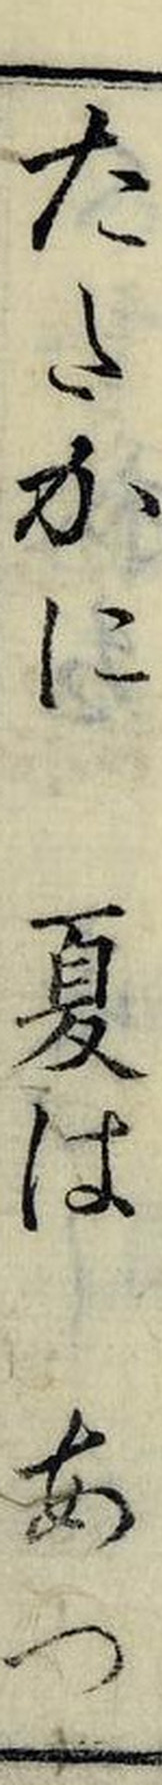たたかに夏はあつ

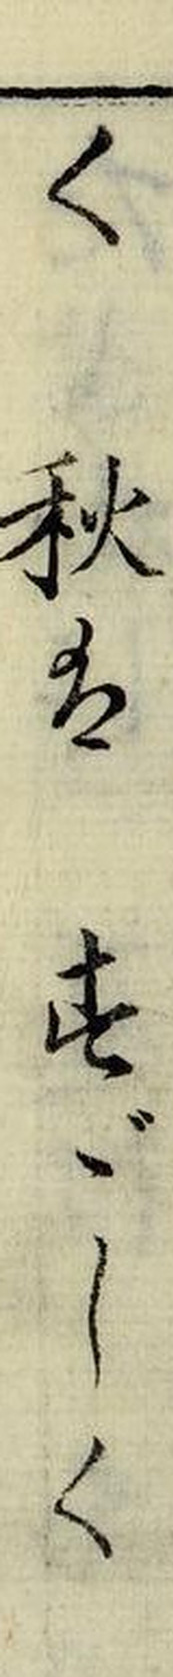く秋はすヾしく
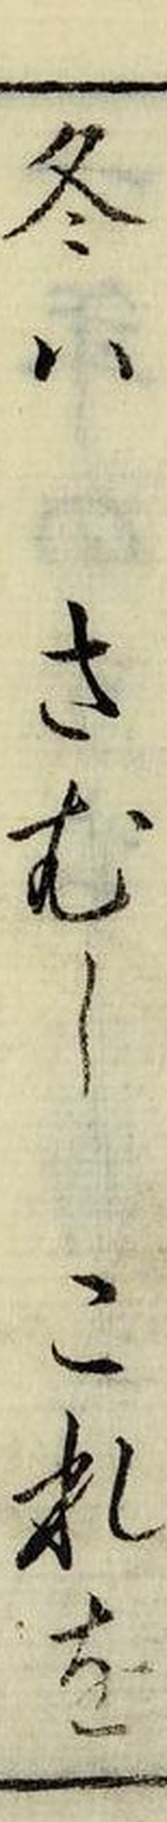冬はさむしこれを
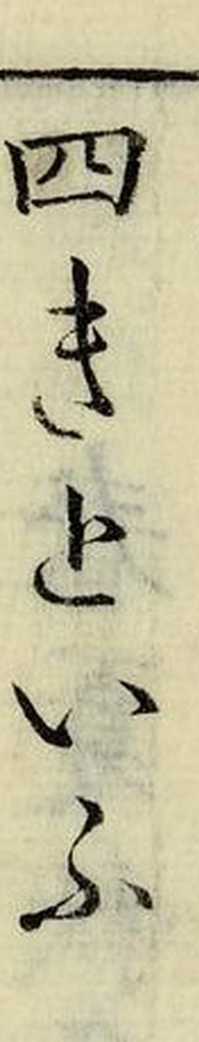四きといふ
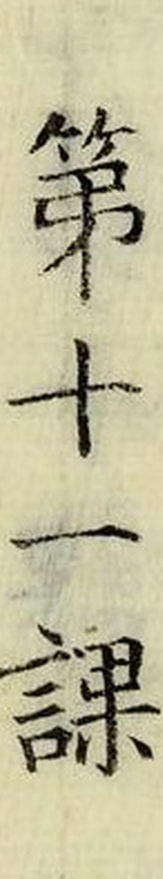第十一課
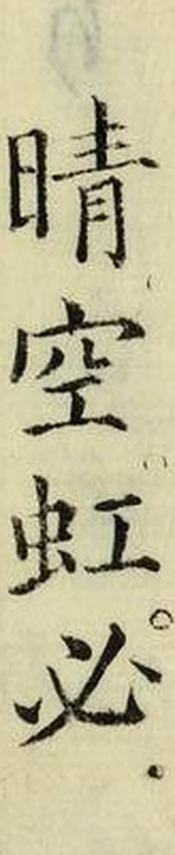晴。空。虹。必。
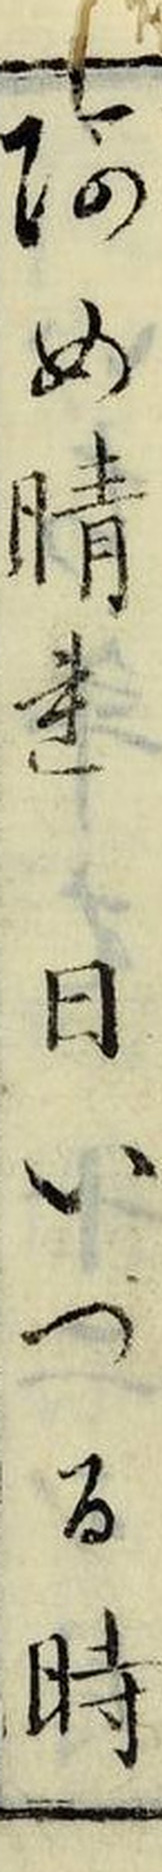あめ晴れ日いつる時
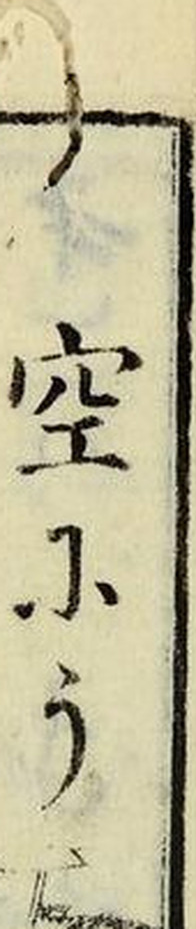空にう
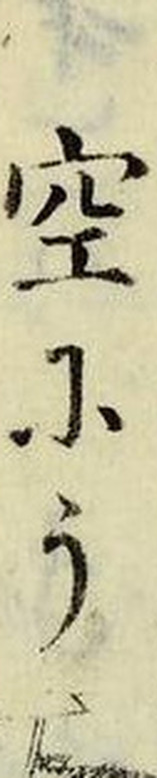空にう
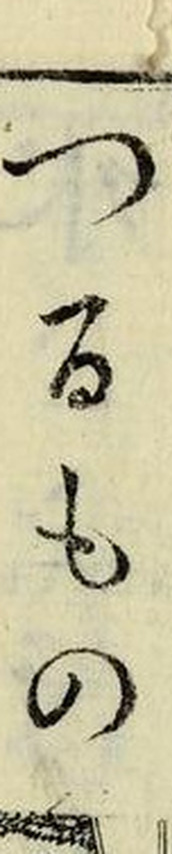つるもの
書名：小学読本 初等科 巻一
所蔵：福井県文書館 Fukui Prefectural Archives
